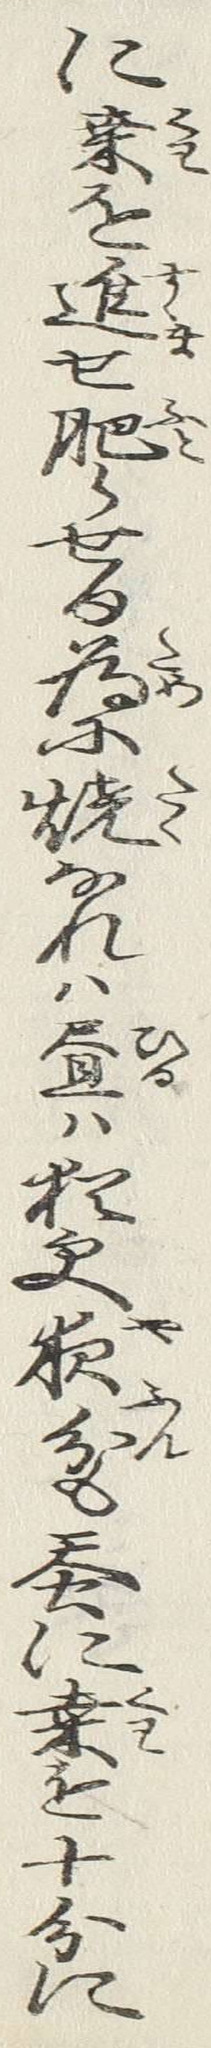に桑を進せ肥らせる為に焼なれは昼は猶更夜分も蚕に桑を十分に
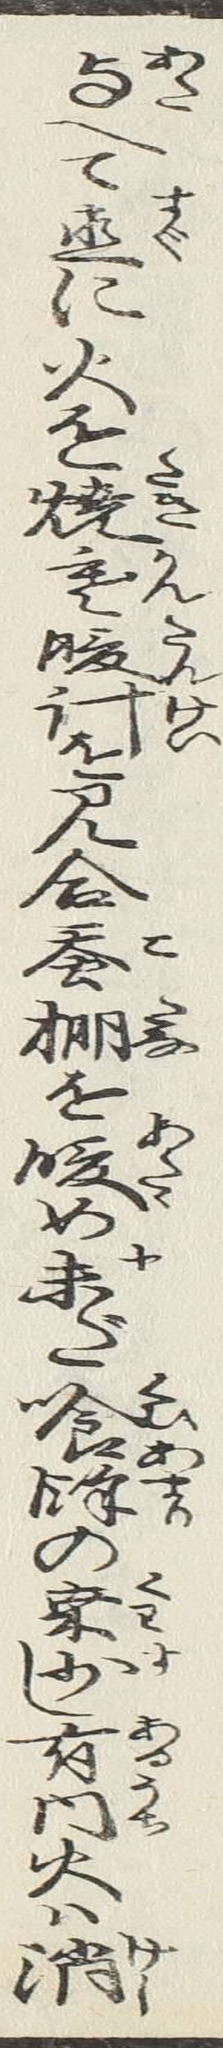与へて直に火を焼寒暖計を見合蚕棚を暖め未だ喰餘の桑少すし有内火は消
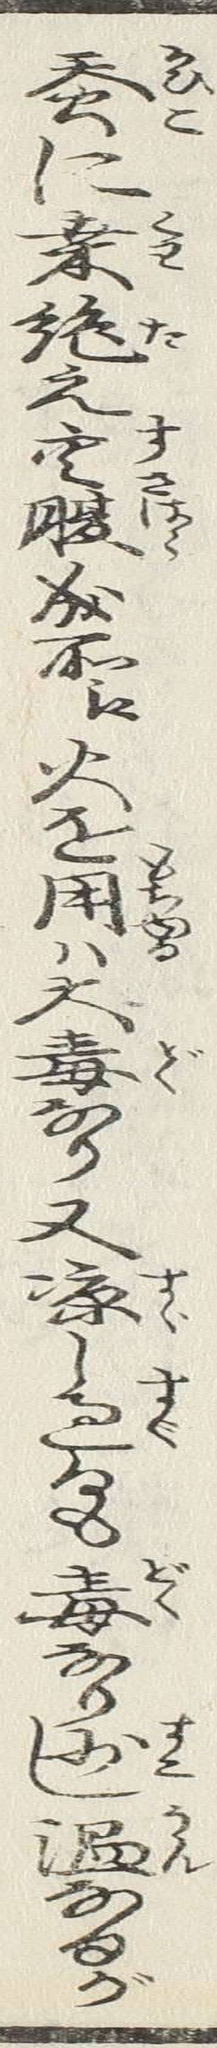蚕に桑絶え空腹成所え火を用は大毒なり又涼し過るも毒なり少し温なるが
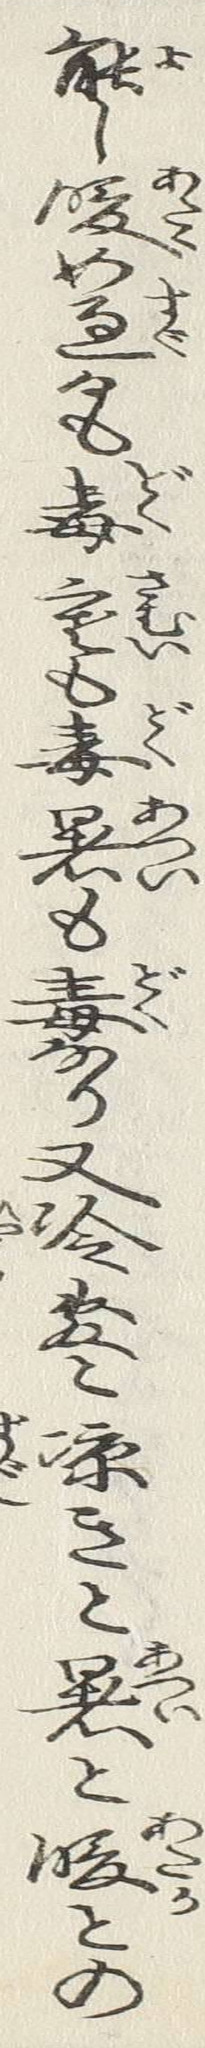能し暖め過るも毒寒も毒暑も毒なり又冷敷と涼きと暑と暖との
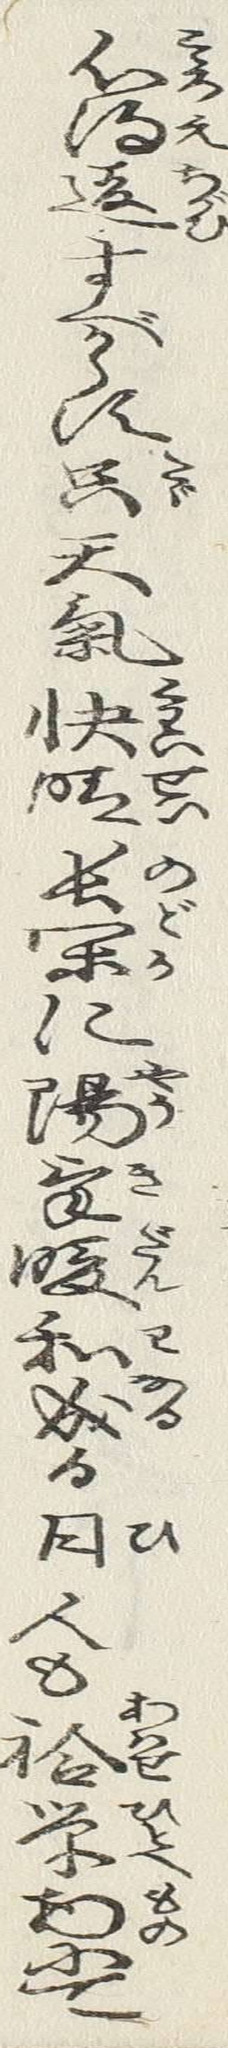心得違すべからす只天氣快晴長閑に陽氣暖和成る日人も袷単物にて
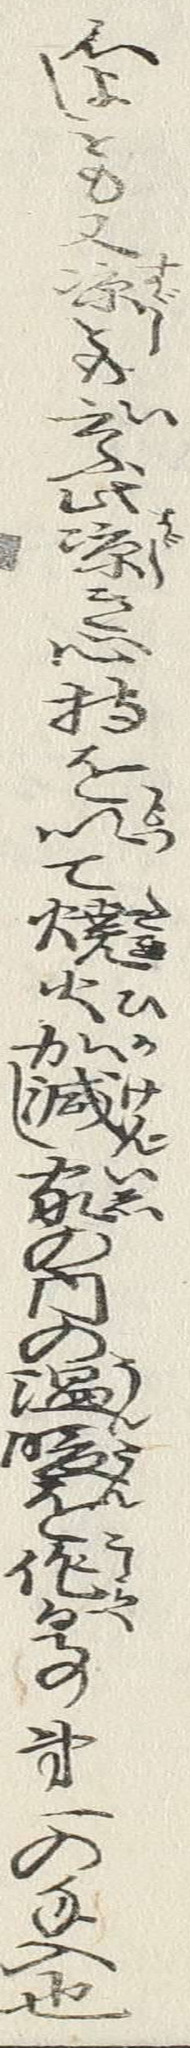心よしとも又涼とも云ふ此涼き心持を以て焼火加減し家の内の温暖を作る事第一の手入也
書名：養蠶實驗録
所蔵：東京大学農学生命科学図書館 国文学研究資料館
